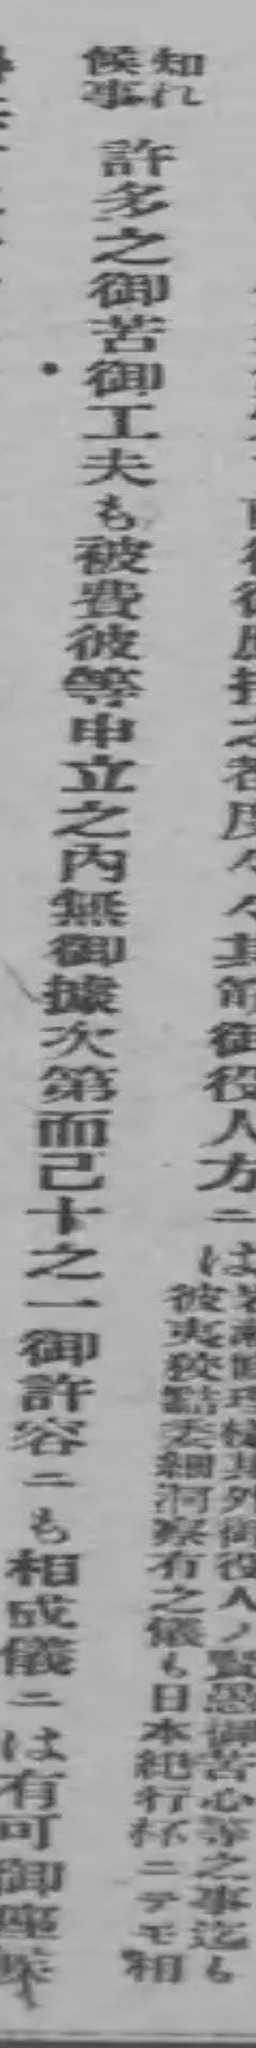知れ候事許多之御苦御工夫も被費彼等申立之内無拠次第而己十之一御許容ニも相成儀ニは有可御座候
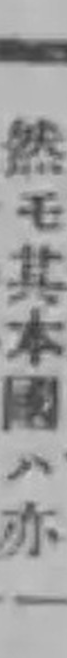然モ其本国ハ亦
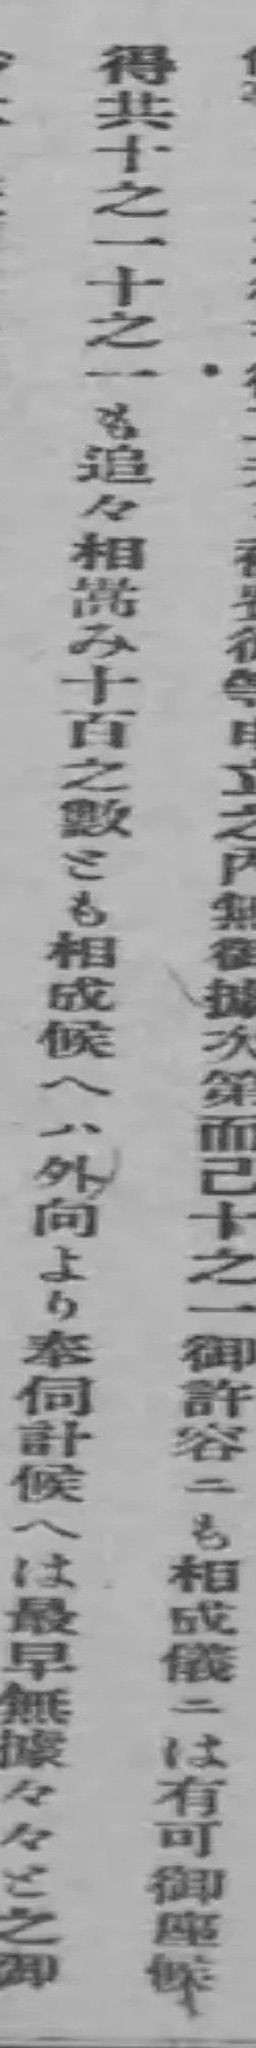得共十之一十之一も追々相嵩み十百之数とも相成候ヘハ外向より奉伺計候へは最早無拠々々と之御
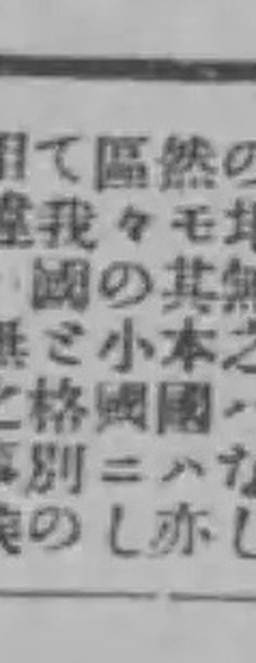区々の小国ニし
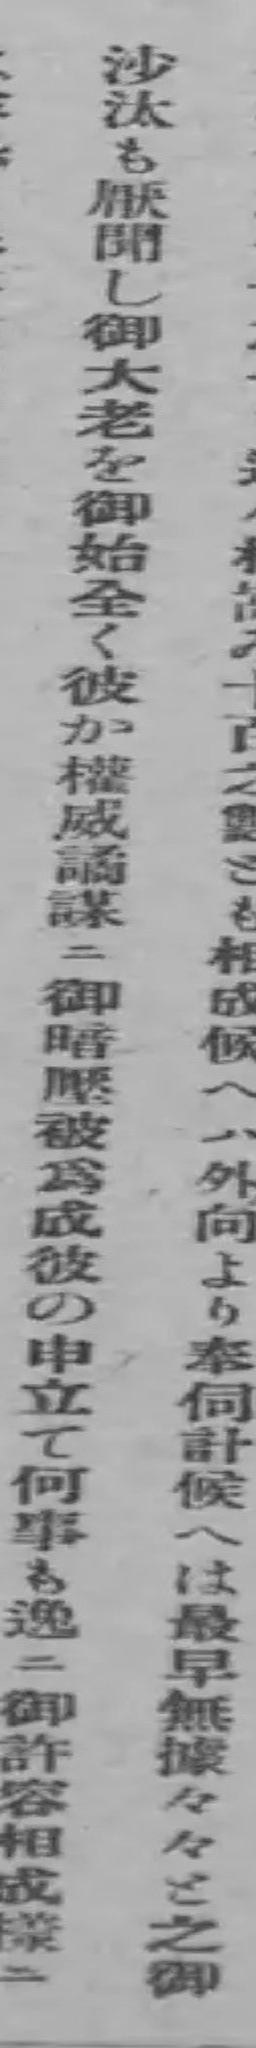沙汰も厭聞し御大老を御始全く彼か権威譎謀ニ御暗厭被為成彼の申立て何事も逸ニ御許容相成様ニ
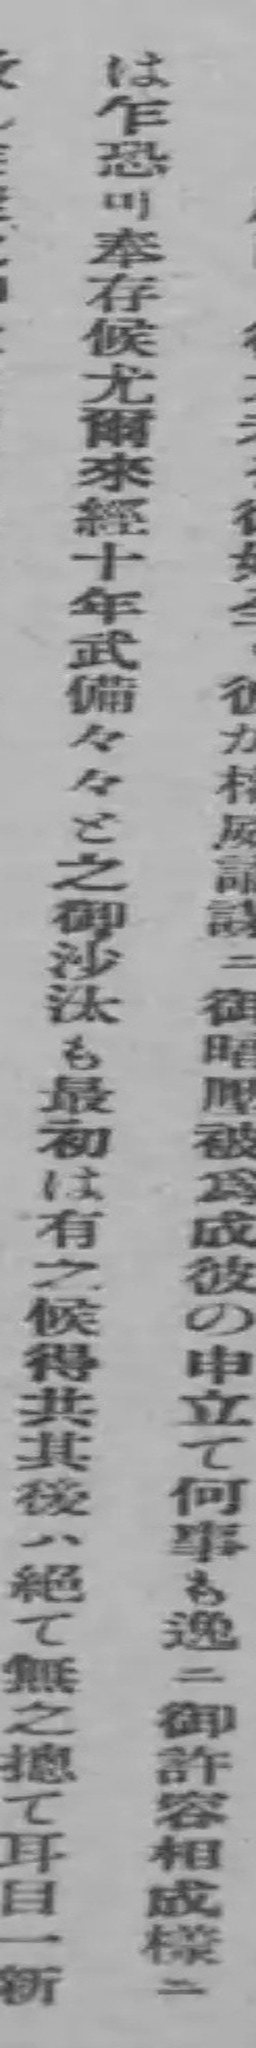は乍恐可奉存候尤爾来経十年武備々々と之御沙汰も最初は有之候得共後ハ絶て無之総て耳目一新
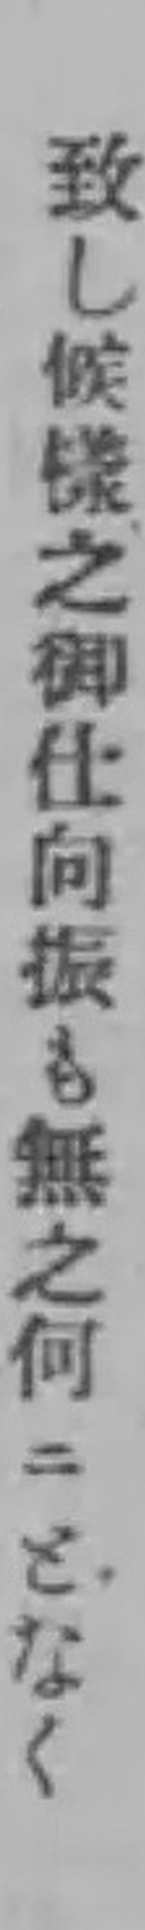致し候様之御仕向振も無之何ニとなく
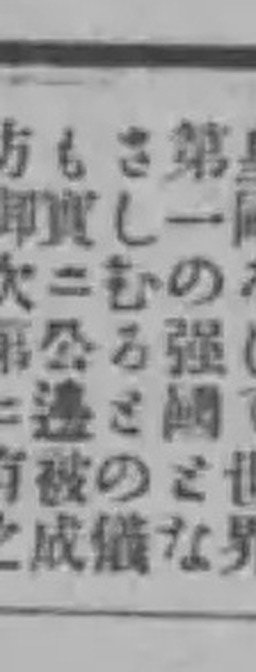さしむるとの儀
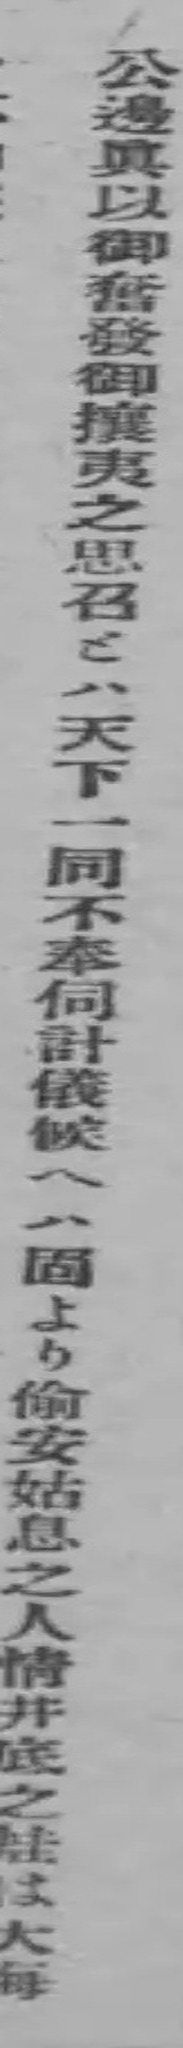公辺真以御奮発御攘夷之思召とハ天下一同不奉伺計儀候ヘハ固より偸安姑息之人情井底之蛙は大海
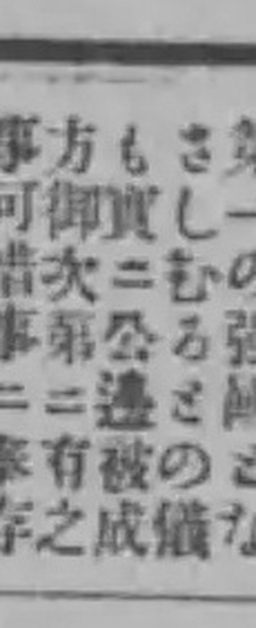も実ニ公辺被成
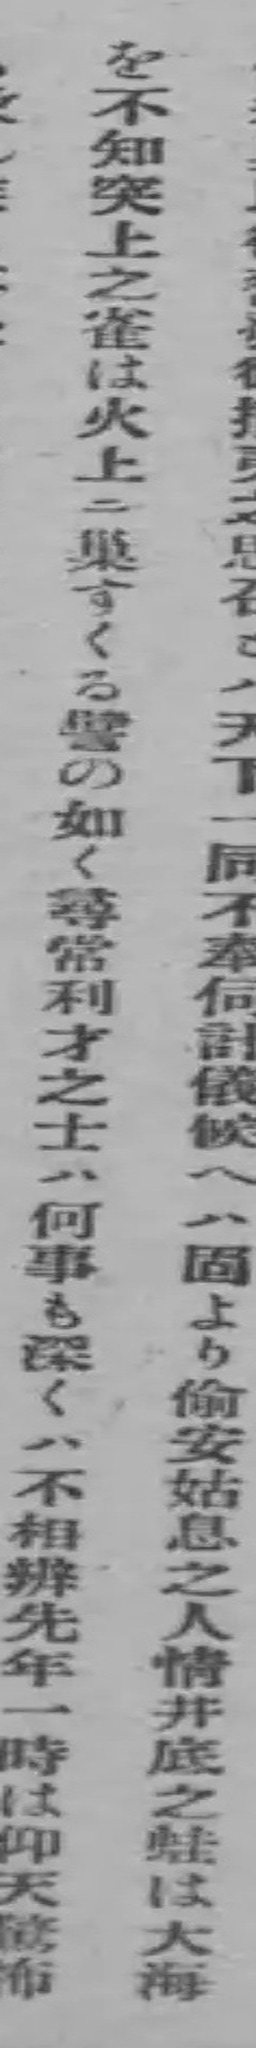を不知突上之雀は火上ニ巣すくる譬の如く尋常利才之士ハ何事も深くハ不相弁先年一時は仰天驚怖
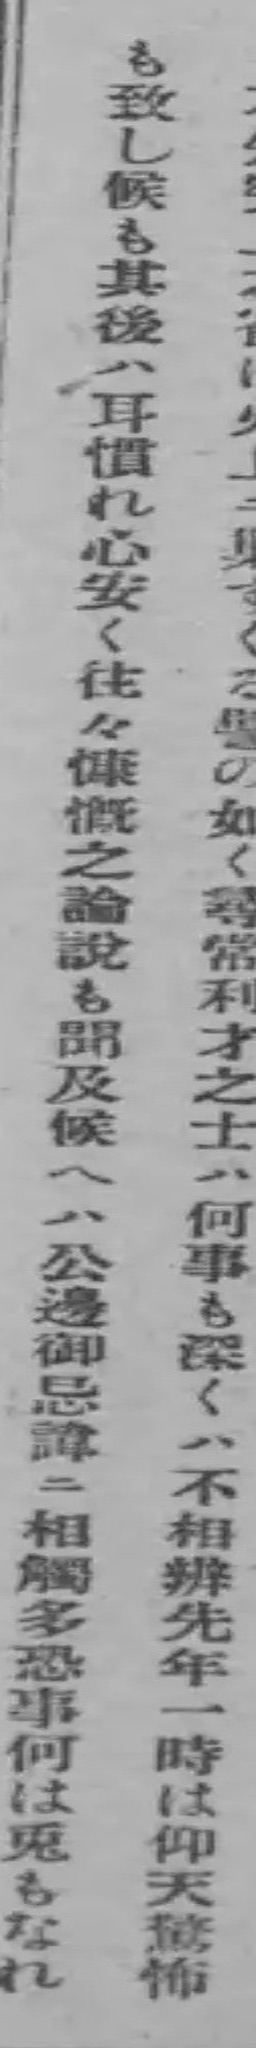も致し候も其後ハ耳慣れ心安く往々慷慨之論説も聞及候ヘハ公辺御忌諱ニ相触多恐事何は兎もなれ
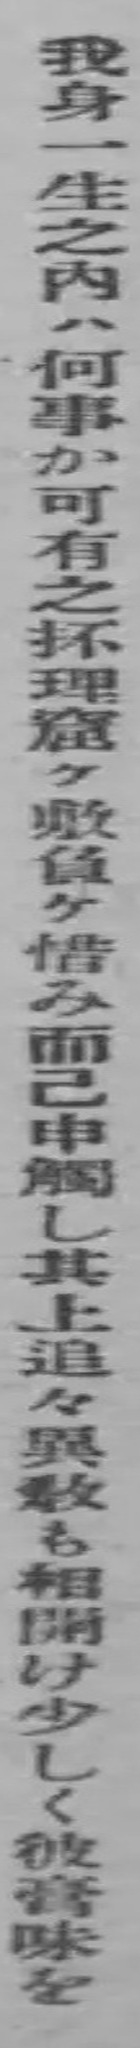我身一生之内ハ何事か可有之抔理屈ケ敷負ケ惜み而己申触し其上追々異教も相開け少しく彼膏味を
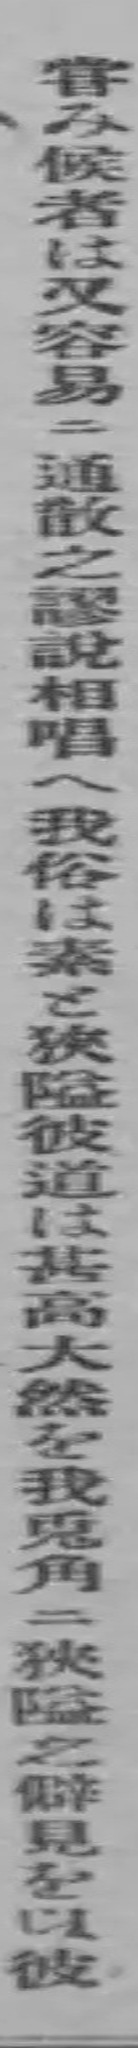嘗み候者は又容易ニ通散之謬説相唱へ我俗は素と狭隘彼道は甚高大然を我兎角ニ狭隘之僻見を以彼
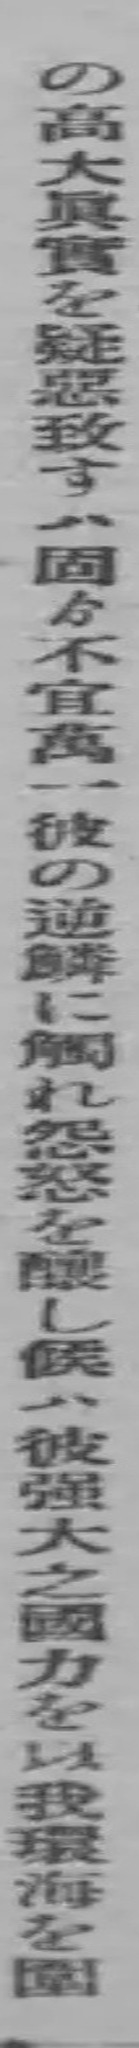の高大真実を疑悪致すハ固ゟ不宜万一彼の逆鱗に触れ怨怒を醸し候ハ彼強大之国力を以我環海を囲
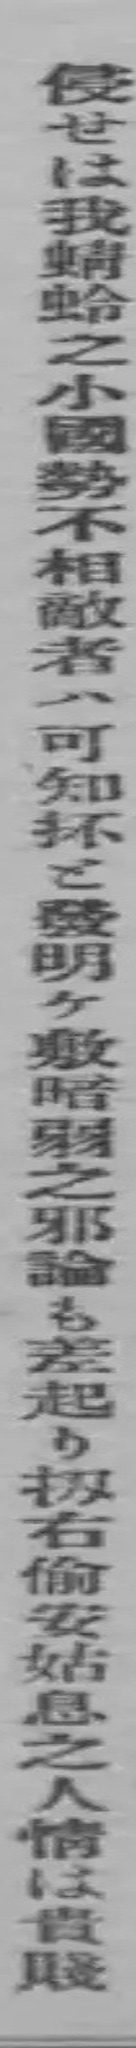侵せは我蜻蛉之小国勢不相敵者ハ可知抔と発明ケ敷暗弱之邪論も差起り扨右偸安姑息之人情は貴賤
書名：豊橋市史談
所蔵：国立国会図書館 National Diet Library, JAPAN
